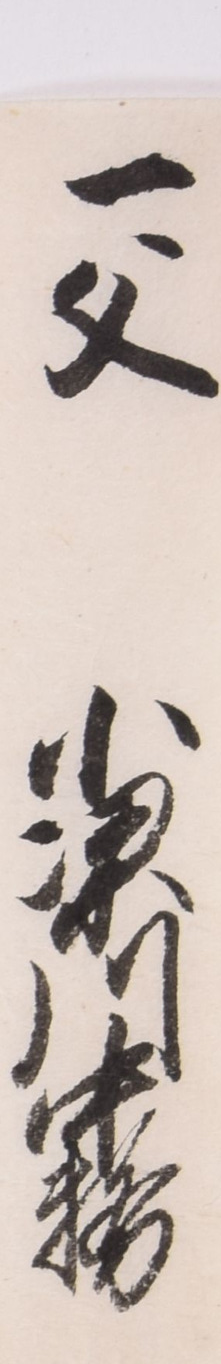一父小梁川中務
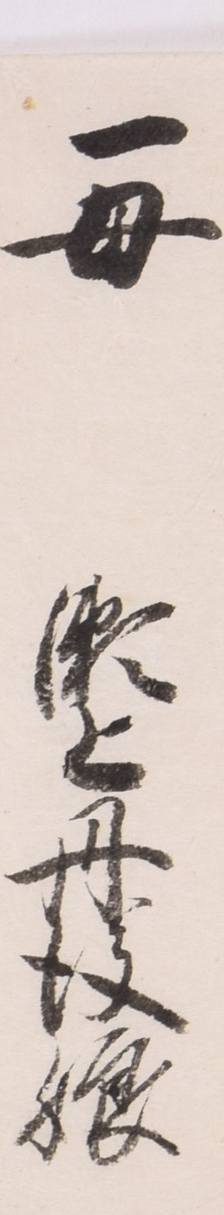一母瀬上丹後娘
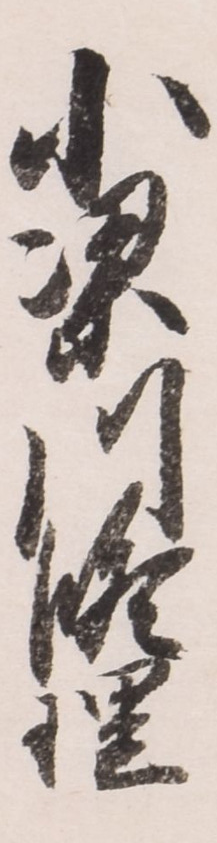小梁川修理
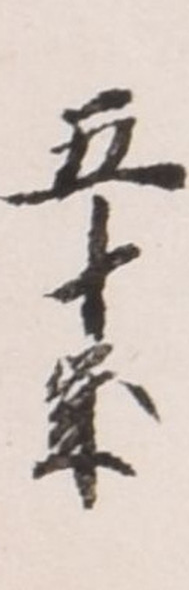五十歳
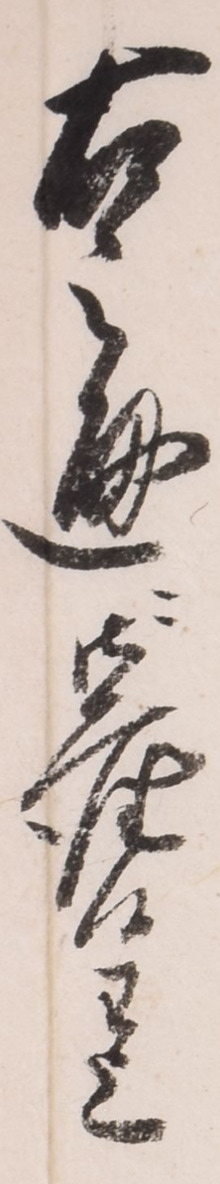右之通ニ御座候已上
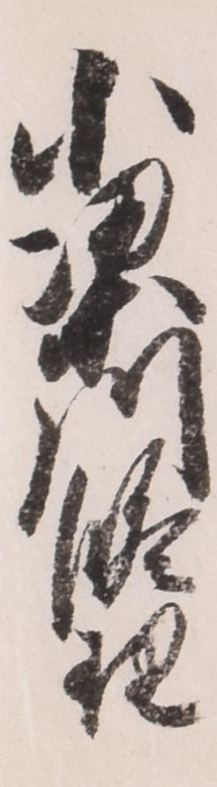小梁川修理
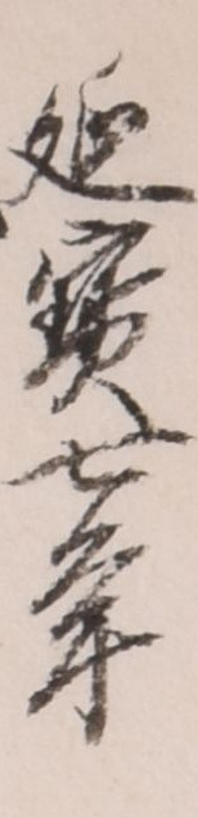延宝七年
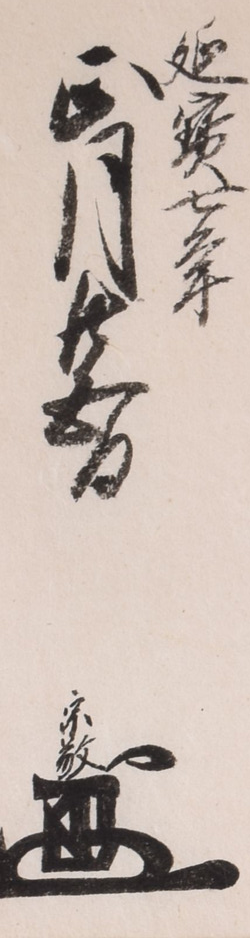正月廿五日花押
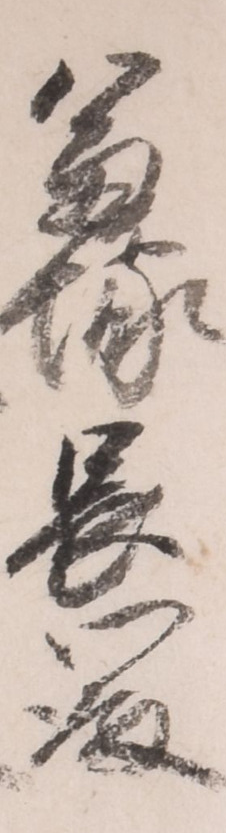冨塚長門殿
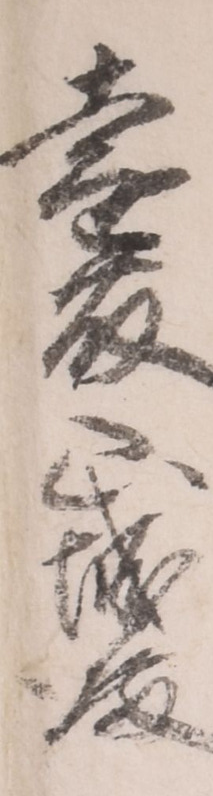遠藤山城殿
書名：「一　父　小梁川中務宗影〜」
